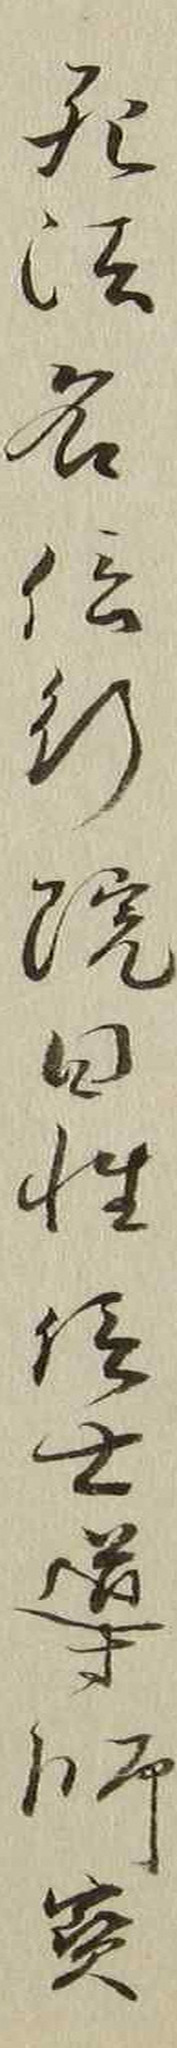死法名信行院日性信士導師宝
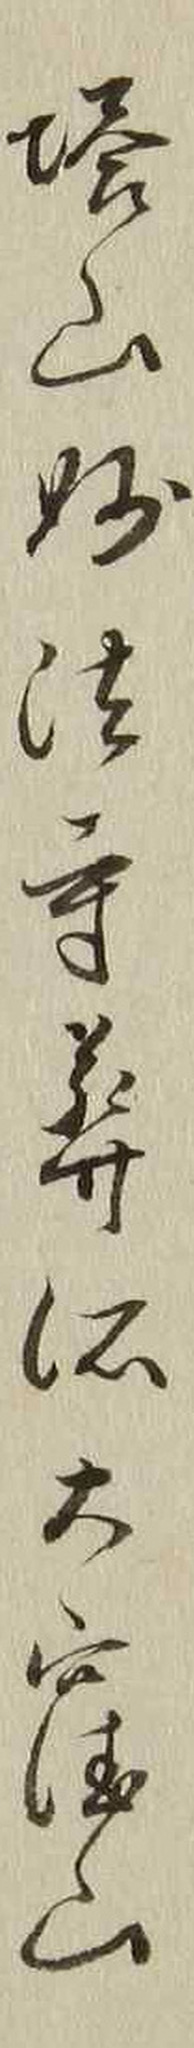塔山妙法寺葬所大窪山
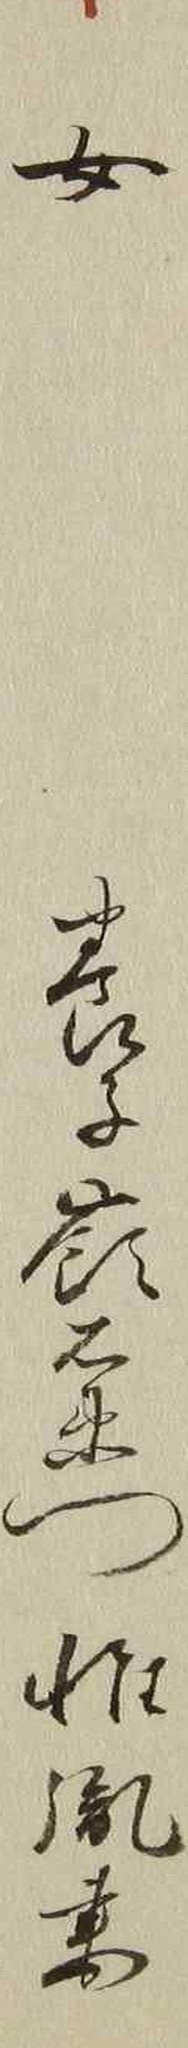女養子嶺右衛門惟胤妻
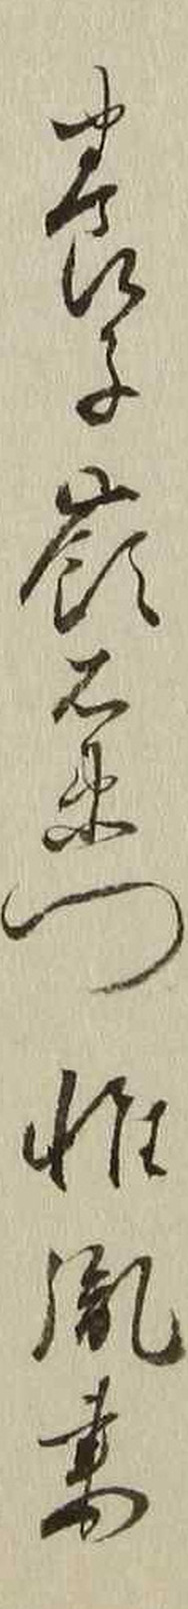女養子嶺右衛門惟胤妻
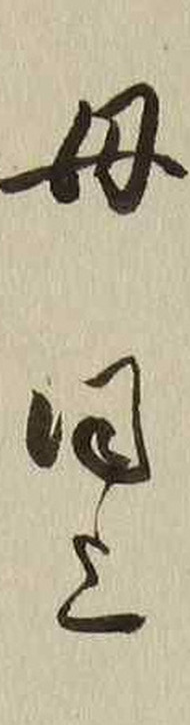母同上
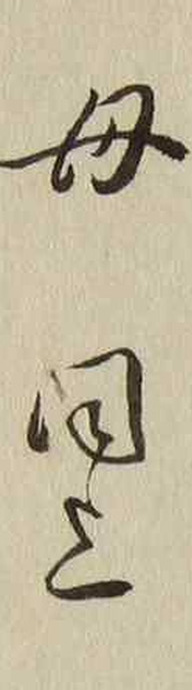母同上
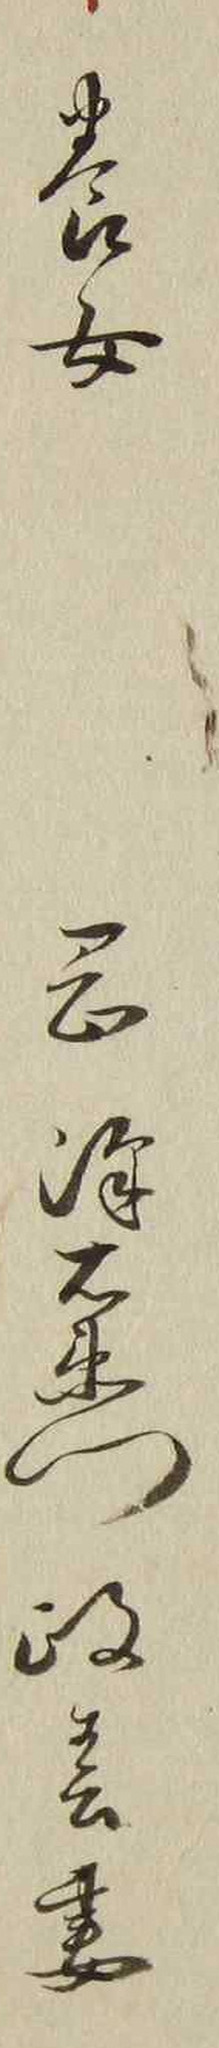養女岡沢右衛門政春妻
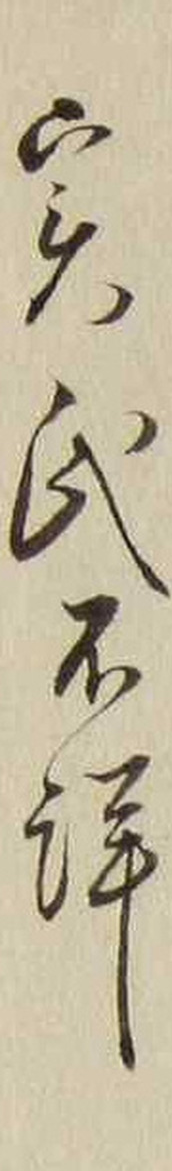実氏不詳

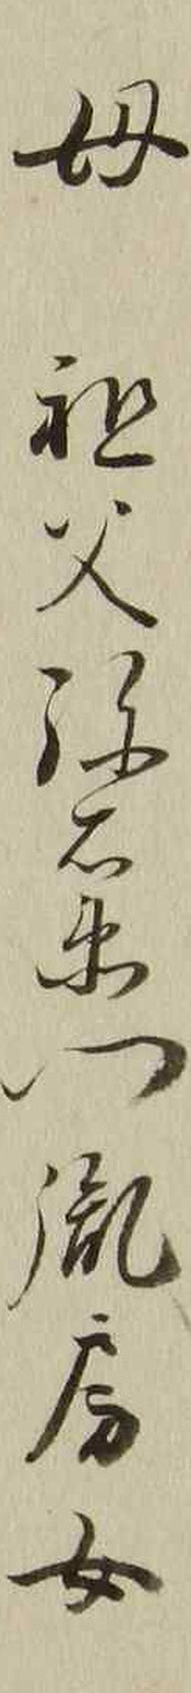母祖父弥右衛門胤房女
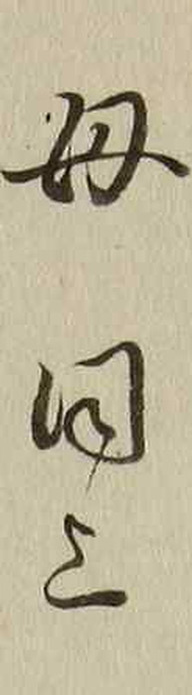母同上
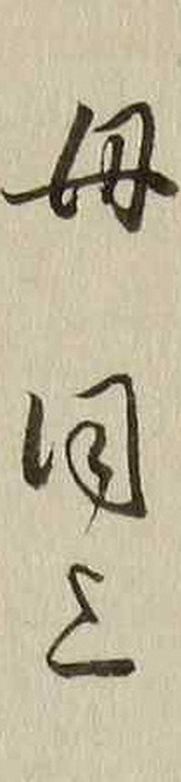母同上
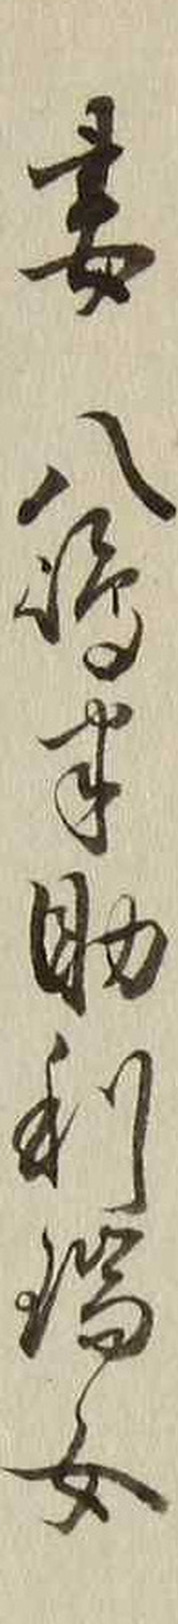妻八嶋半助利瑞女
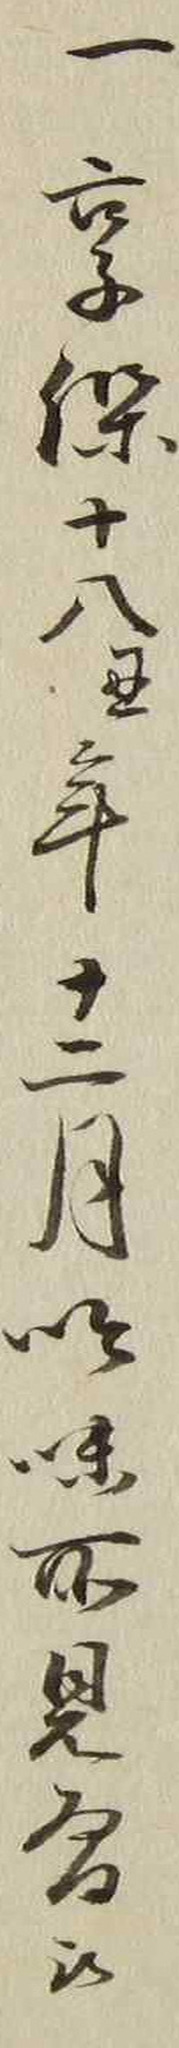一享保十八丑年十二月吟味所見習被
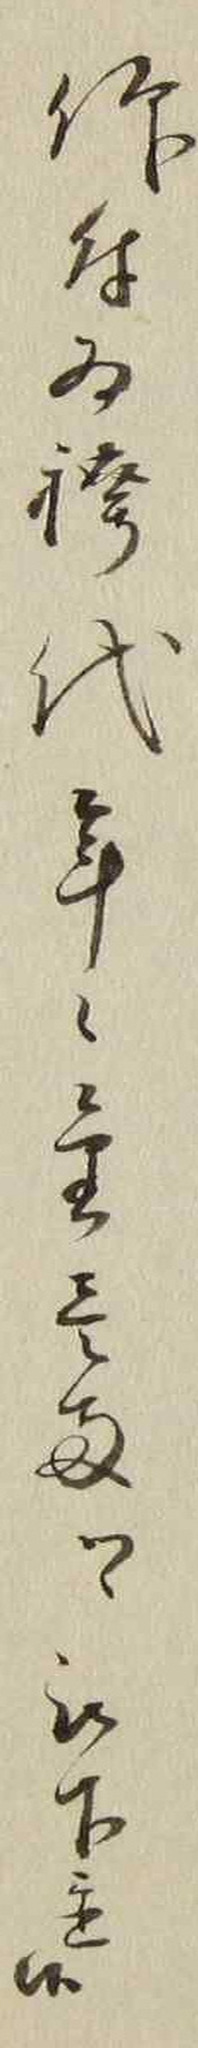仰付為袴代年々金壱両ツヽ被下置候
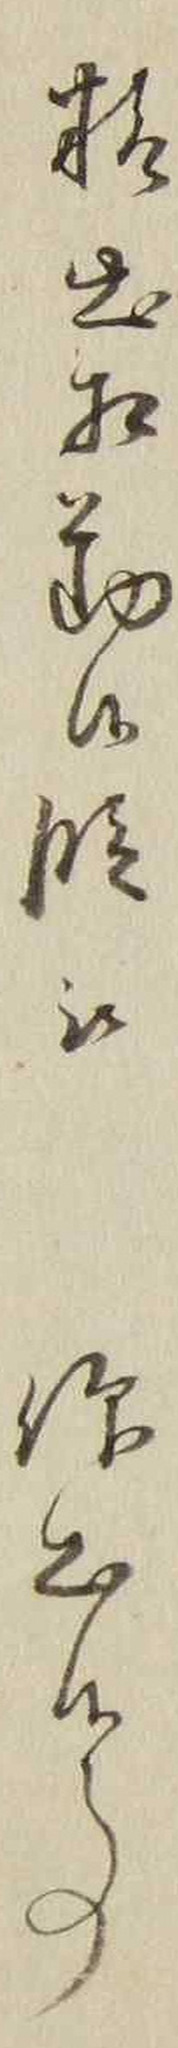精出相勤候段被仰出候事

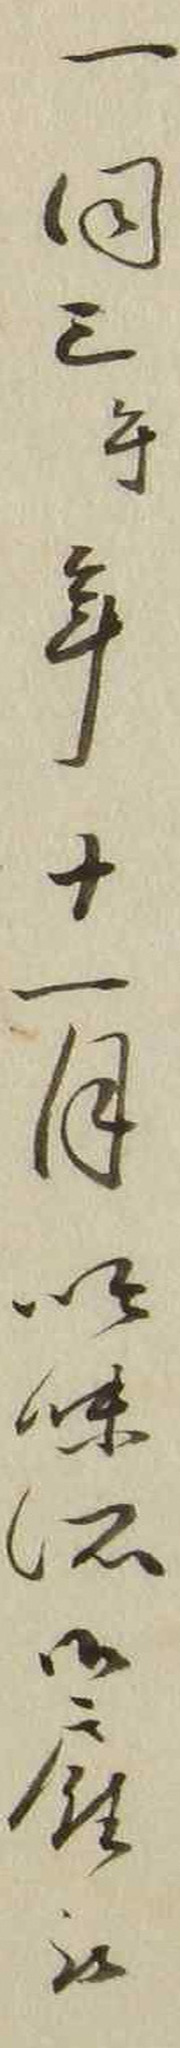一同三午年十一月吟味所御雇被
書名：諸士系譜　巻之52　に之部3
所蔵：会津若松市立会津図書館
